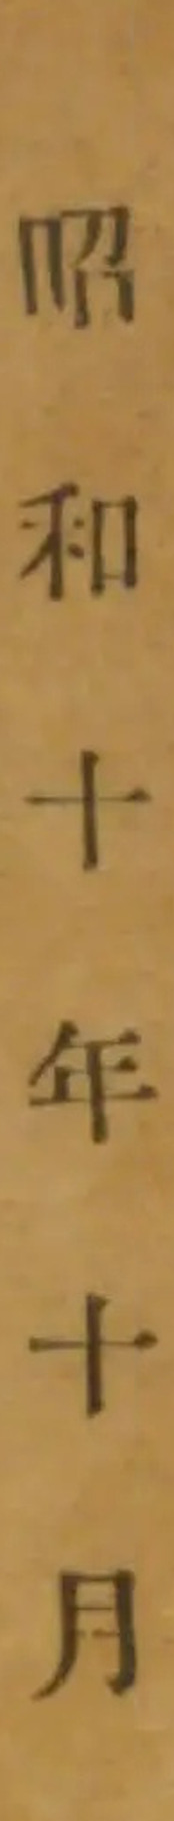昭和十年十月

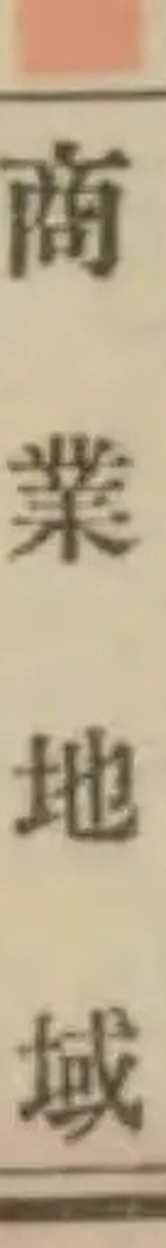工業地域
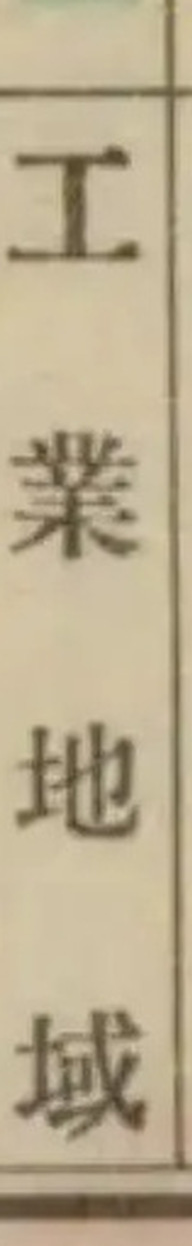工業地域
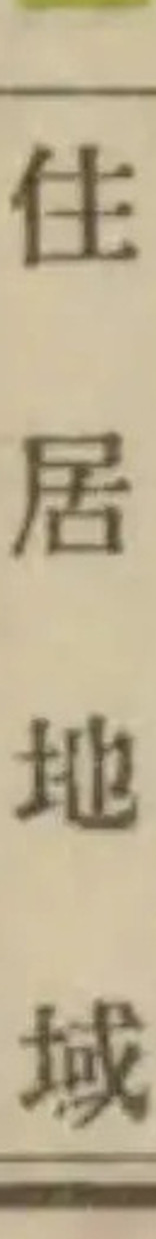住居地域
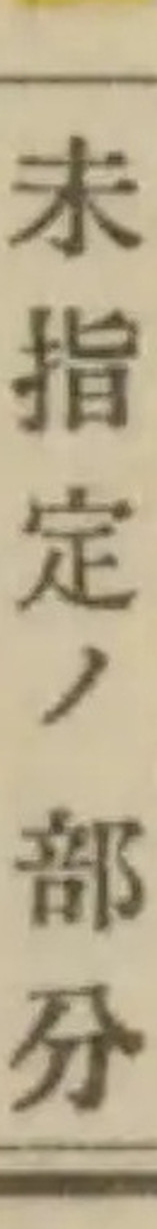未指定ノ部分
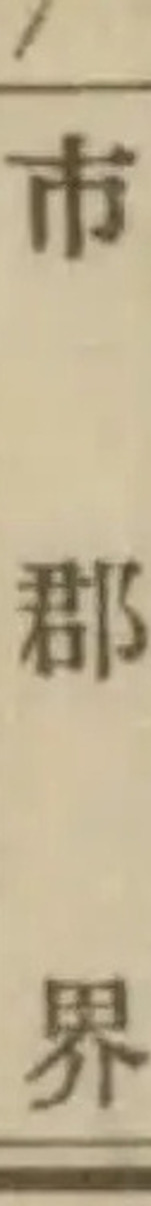市郡界
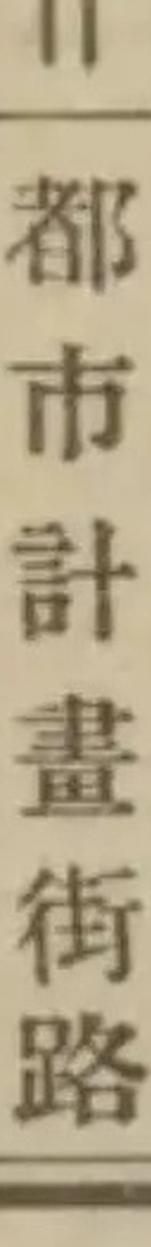土地計画街路

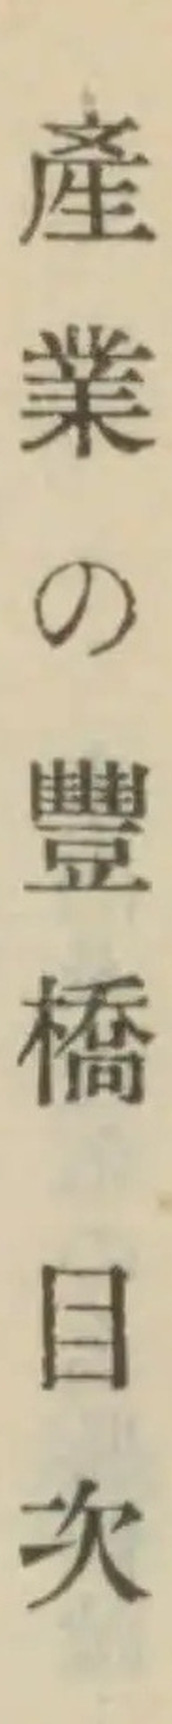産業の豊橋目次

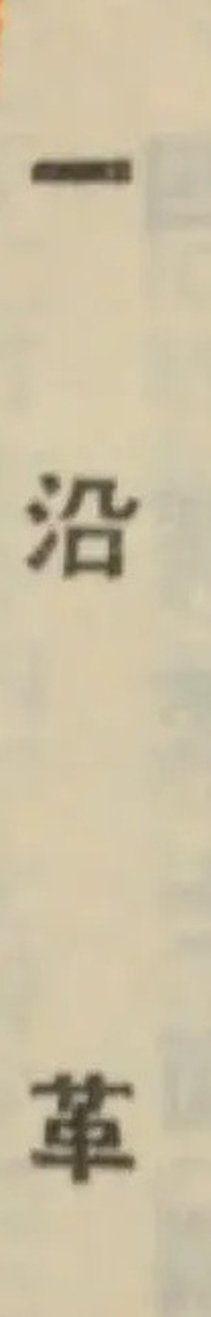一沿革
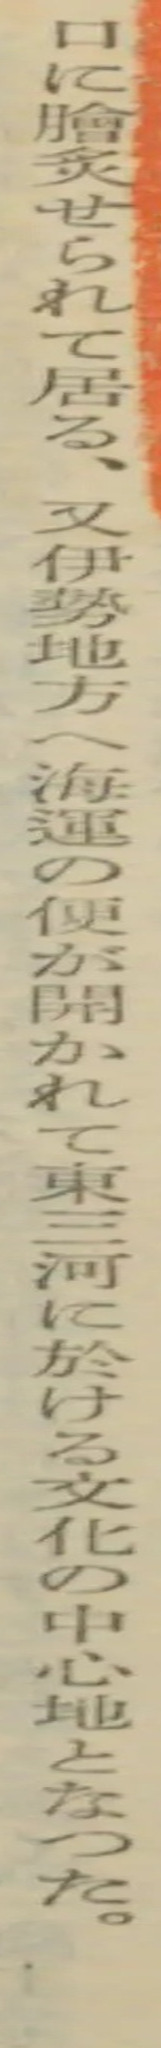口に膾炙せられて居る、又伊勢地方へ海運の便が開かれて東三河に於ける文化の中心地となつた。
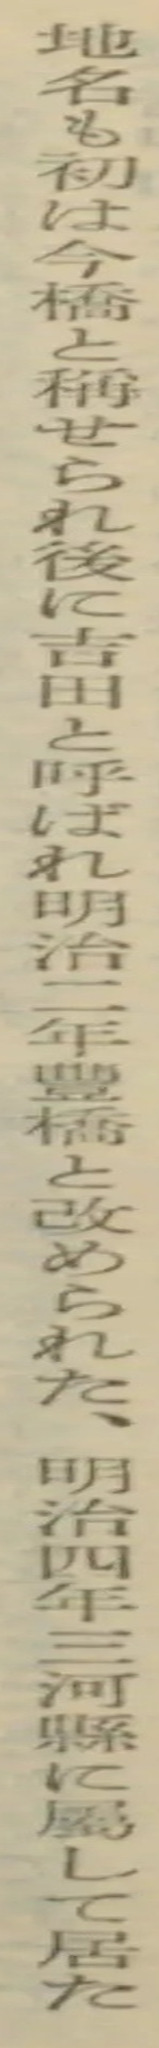地名も初は今橋と称せられ後に吉田と呼ばれ明治二年豊橋と改められた、明治四年三河県に属して居た
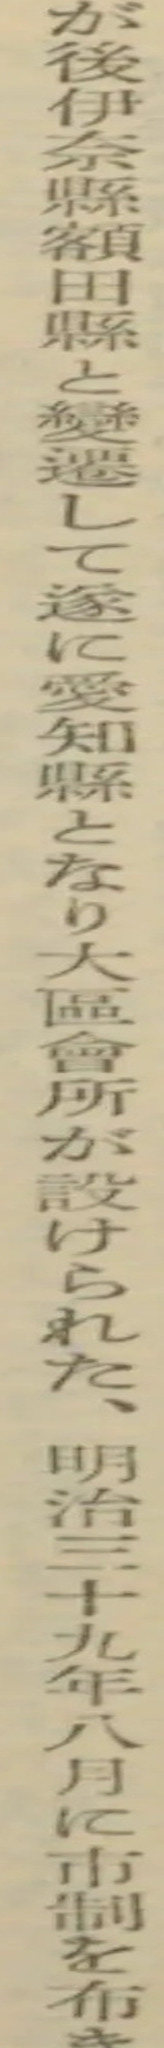が後伊奈県額田県と変遷して遂に愛知県となり大区会所が設けられた、明治三十九年八月に市制を布き
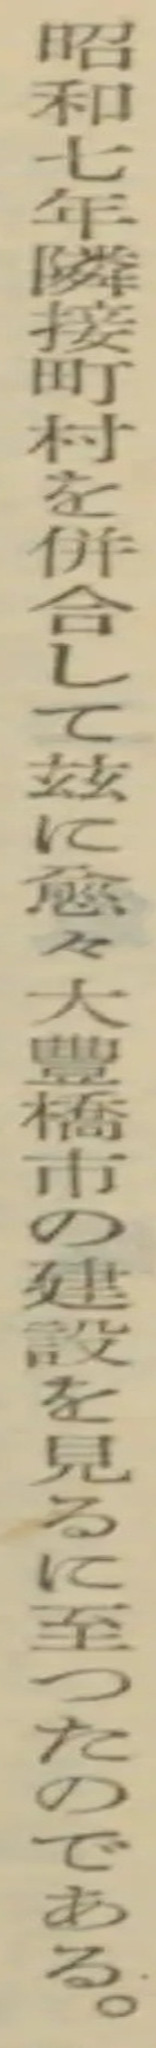昭和七年隣接町村を併合して茲に愈々大豊橋市の建設を見るに至つたのである。

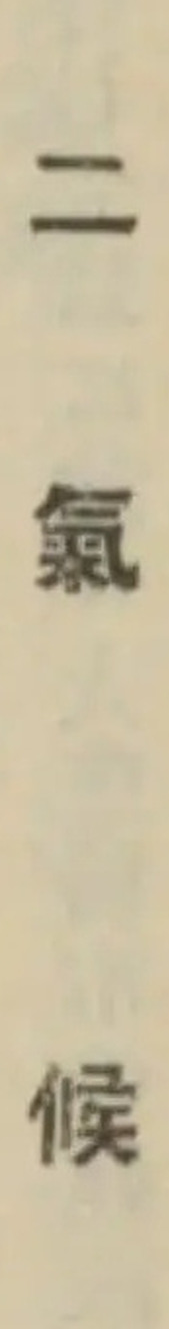二気候
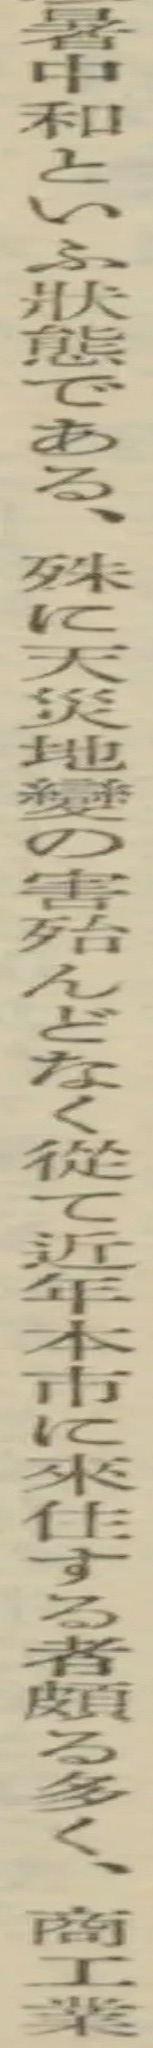寒暑中和といふ状態である、殊に天災地変の害殆んどなく従て近年本市に来住する者頗る多く、商工業
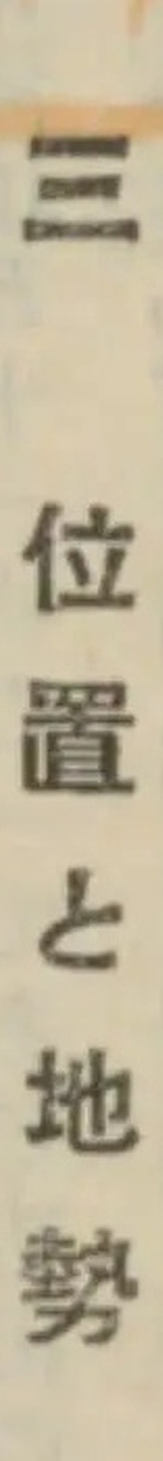三位置と地勢
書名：産業の豊橋
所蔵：国立国会図書館 National Diet Library, JAPAN
